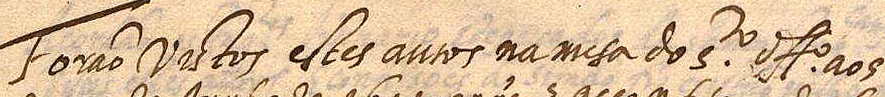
Foraõ Vistos estes autos na mesa do s.to offo aos
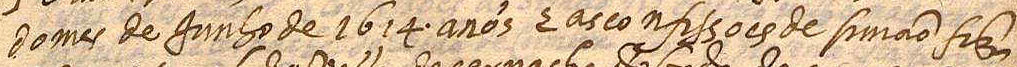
do mes de Junho de 1614. anos̄ E as confissoes de simaõ frz̄
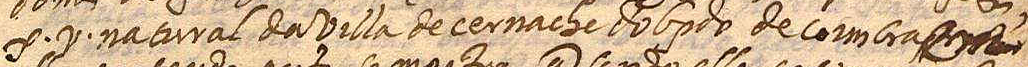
x. v. natural da villa de cernache do bpdo de coimbra Cristão
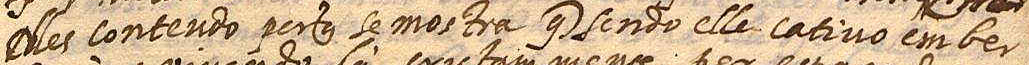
Nles conteudo porq̄ se mostra q̄ sendo elle catiuo em ber
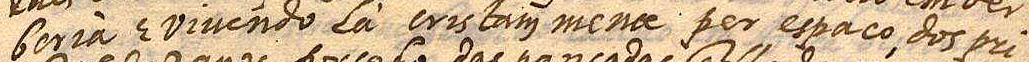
beria, E viuendo lá cristammente per espaço dos pri
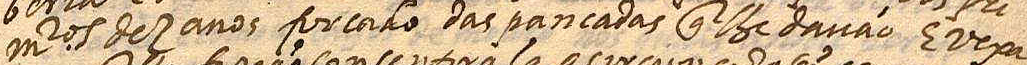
m.ros dez anos forçado das pancadas q̄ lhe dauaõ E vexa
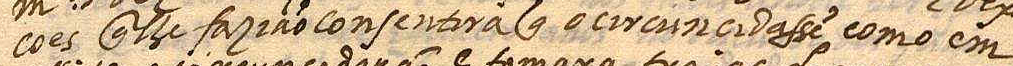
çoes q̄ lhe faziaõ consentira q̄ o circuncidassē como em
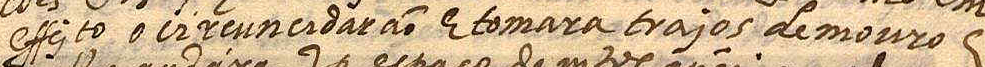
effeito o circuncidaraõ E tomara trajos de mouro E
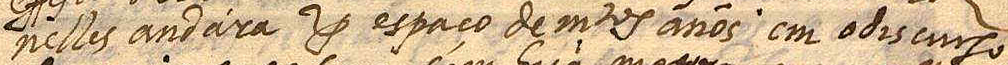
nelles andara p̄ espaço de mtos anōs em o discurso
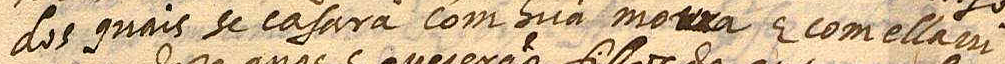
dos quais se casara com huā moura, E com ella ui
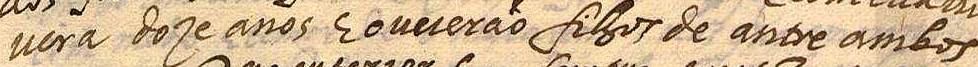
uera doze anos, E ouuerão filhos de antre ambos
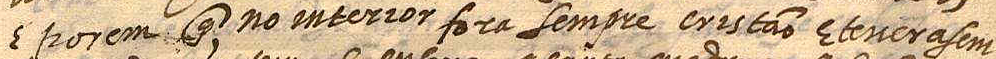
E porem q̄ no interior fora sempre cristaõ E teuera sem
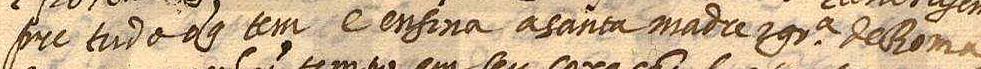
pre tudo o q̄ tem e ensina a santa madre igr.a de Roma
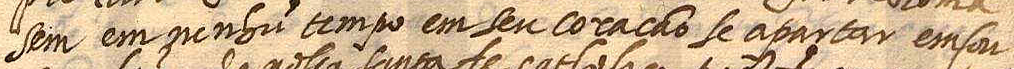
sem em nenhū tempo em seu coraçaõ se apartar em Cou
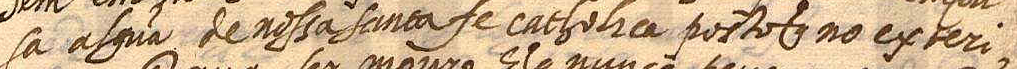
sa alguā de nossa santa fe catholica posto q̄ no exteri
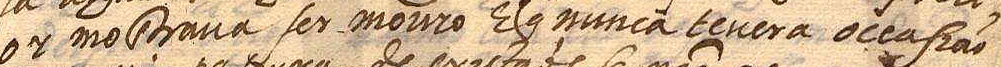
or mostraua ser mouro E q̄ nunca teuera occasiaõ
